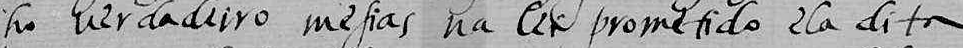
ho uerdadeiro mesias na lei prometido ela dita
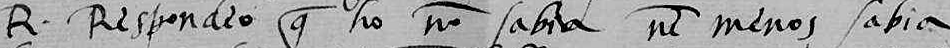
R. Respondeo q̄ ho n̄o sabia n̄e menos sabia
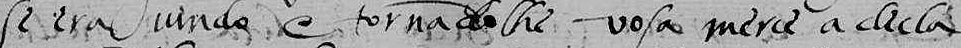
se era uindo e tornādolhe vosa merce a decla
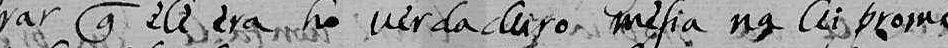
rar q̄ ele era ho uerdadeiro mesia na lei prome
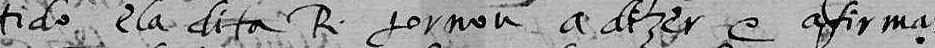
tido ela dita R. tornou a dizer e afirmar
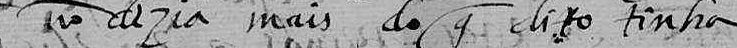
q̄ n̄o dezia mais do q̄ dito tinha
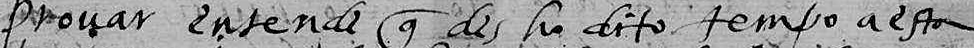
Prouar entende q̄ des ho dito tempo a esta
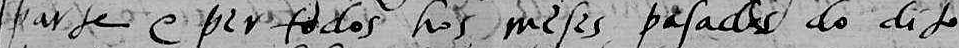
parte e per todos hos meses pasados do dito
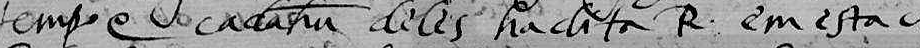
tempo e cada hū deles ha dita R. em esta ci
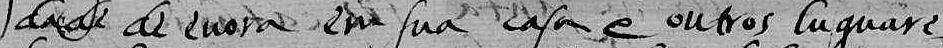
dade de euora em sua casa e outros luguares
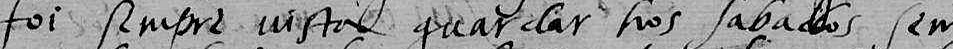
foi sempre uista guardar hos sabados sem
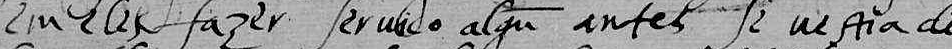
em eles fazer seruiço algū antes se uestia de
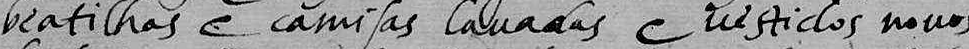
beatilhas e camisas lauadas e uestidos nouos
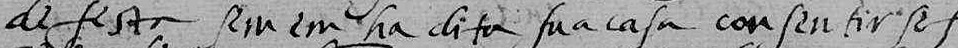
de festa sem em ha dita sua casa consentir se fi
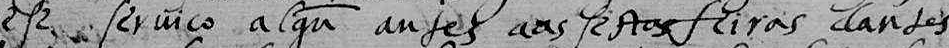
zese seruiço algū antes aas sestas feiras dantes
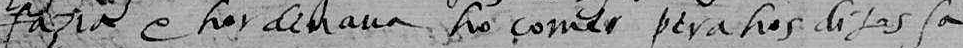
fazia e hordenaua ho comer pera hos ditos sa
